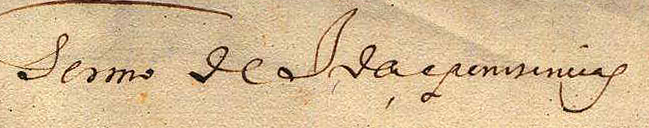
Termo de Ida, e penitencias
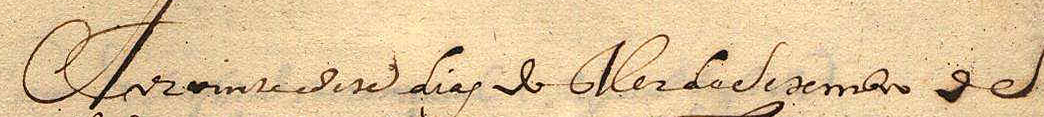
Aoz vinte e sete dias do Mez de Setembro de
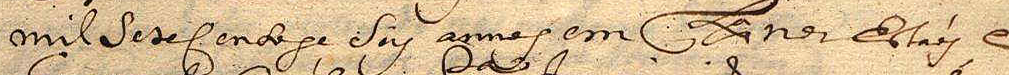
mil seteCentos e seis annos em Lxa nos Estaós e
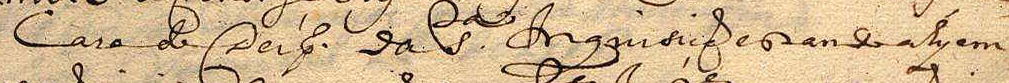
Caza do Desp.o da s.ta Inquisiçaõ estando ahy em
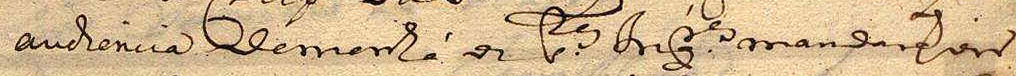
audiencia de menhã os s.res Inq.res mandarā vir
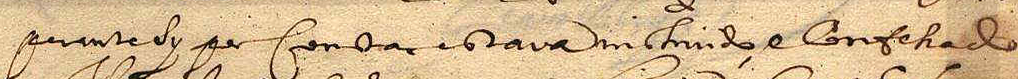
perante sy por Contar estava instruido, e Confessado
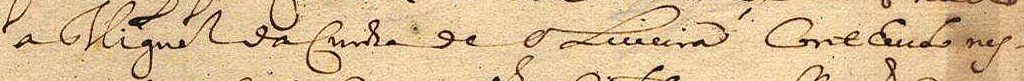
a Miguel da Cunha de oLiueira Contheudo nes
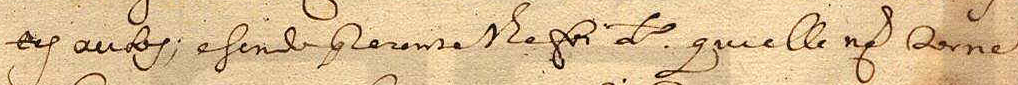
tes autos; e sendo pRezente lhe foi d̄.o que elle naõ torne
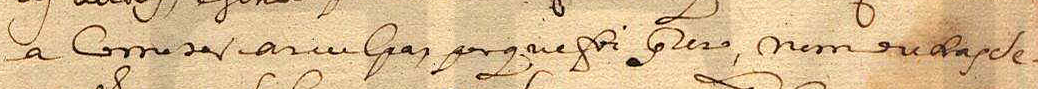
a Cometer as culpas porque foi pRezo, nem outras se
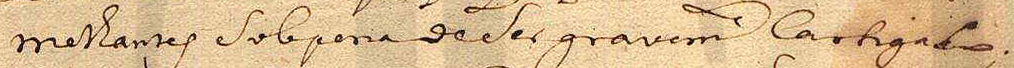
melhantes sob pena de ser gravemte Castigado;
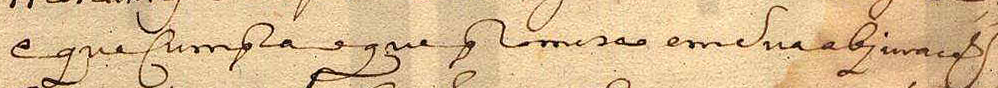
e que CumpRa o que pRometeo em Sua abjuraçaõ
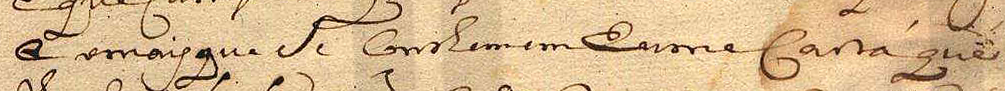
e o mais que se conthem em huma Carta que
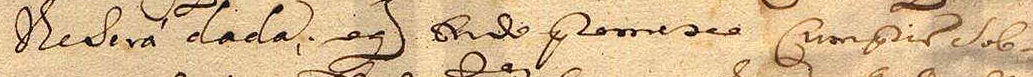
lhe Será dada; o q̄ tudo pRometeo CumpRir Sob
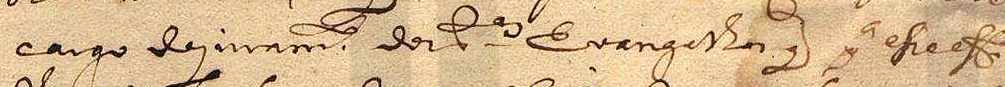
cargo do juram.to dos stos Evangelhos q̄ pa esse eff.o
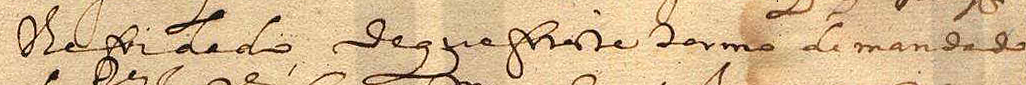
lhe foi dado, de que fis este termo de mandado
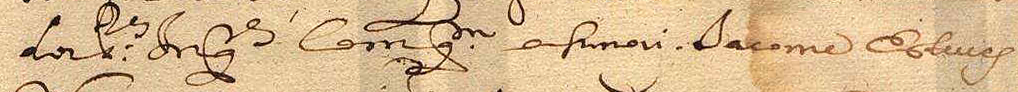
dos s:res Inqres Com q.m assinei. Iacome Esteues
